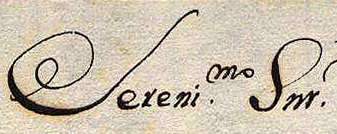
Sereni.mo Snr̄.
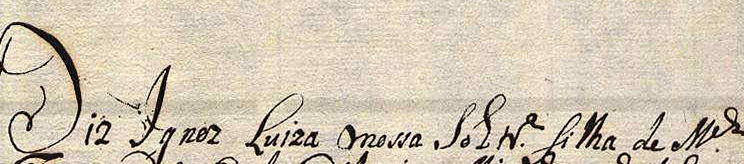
Diz Ignez Luiza mossa Soltr.a filha de M.el
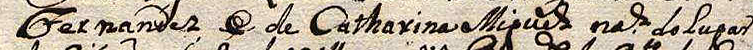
Fernandez E de Catharina Miguel na.l do Lugar
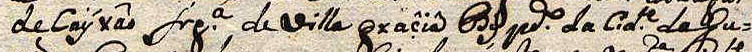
de Cayxaõ frg.a de villa gracia Bspd.o da Cid̄.e da Gu
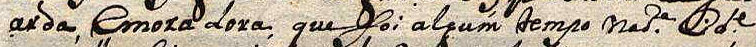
arda, E moradora, que foi algum tempo na d.a Cid;e
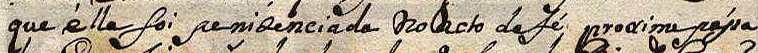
que ella foi penitenciada no Acto da fé, proximo passa
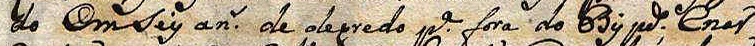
do Em seis an.s de degredo p.a fora do Bispd;o E naõ
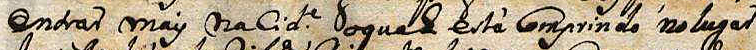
Entrar mais na Cid̄.e o qual está Comprindo no lugar
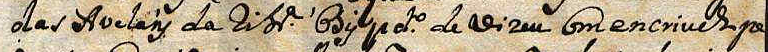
das Avelan̄s da Ribr.a Bispd.o de vizeu Com encriuel pe
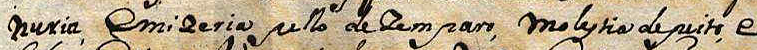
nuria, E mizeria pello deZemparo, molestia de peito, e
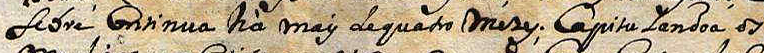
febre Continua há mais de quatro mezes; CapituLandoa os
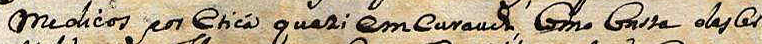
Medicos por Etica quazi emcurauel, Como Consta das Cer
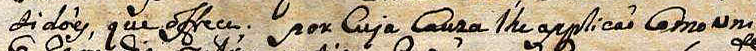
tidoẽs, que offrece; por Cuja Cauza lhe applicaõ Como uni
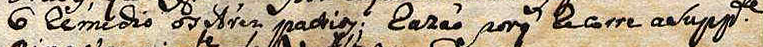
Co Remedio os Arez patrios; Razaõ porq̄ Recorre a Supp.te
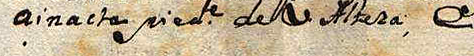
ai nacta pied̄.e de V Alteza, E
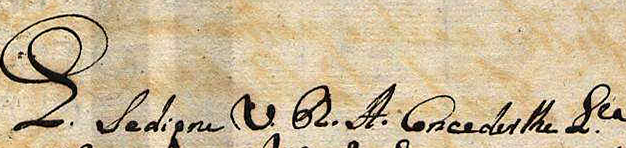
P. Sedigne V.R.A. Concederlhe L.ca
